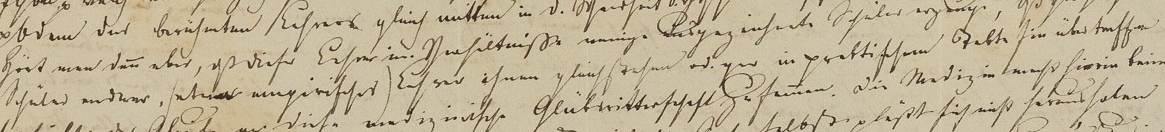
Schüler anderer (etwa empirischer) Lehrer ihnen gleichstehen od. gar in praktischem Takte sie über treffen
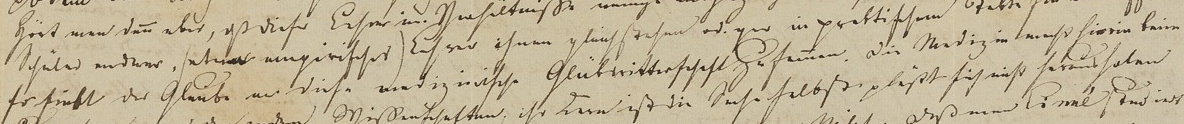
so sinkt der Glaube an diese medizinische Glüksritterschaft zu sammen. Die Medizin macht hierin keine
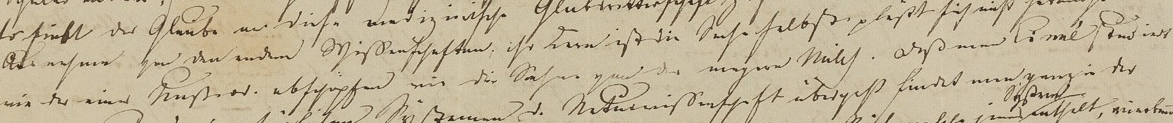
wie der einer Nuß od. abschöpfen wie die Sahne von der magern Milch. Dß man Linné studiert
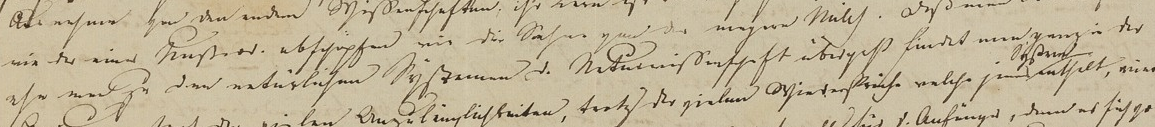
ehe man zu den natürlichen Systemen d. Naturwissenschaft übergeht findet man ganz in der
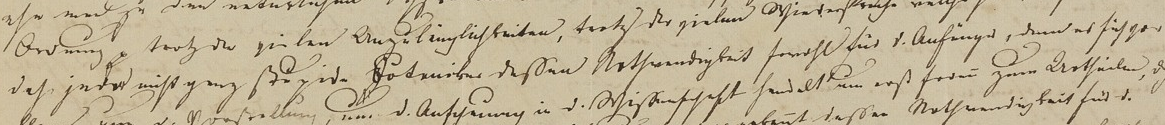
doch jeder nicht ganz stupide Botaniker dessen Nothwendigkeit sowohl für d. Anfänger, dem es sich vor
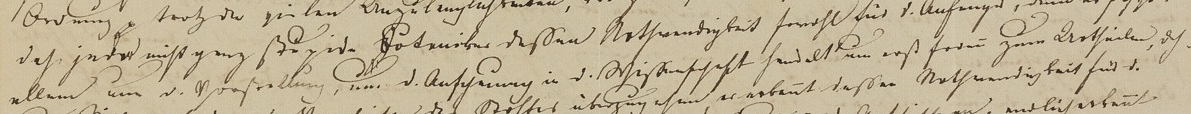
allem um d. Vorstellung, um d. Anschauung in d. Wissenschaft handelt um erst sodann zum Urtheile, d. h.
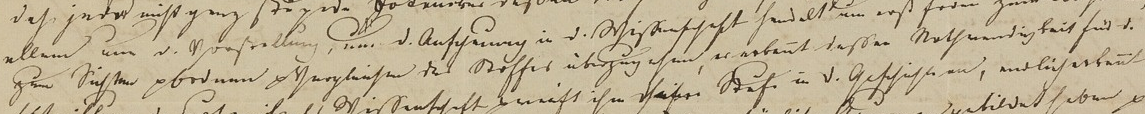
zum Sichten & Ordnen & Vergleichen des Stoffes überzugehen, er erkennt dessen Nothwendigkeit für d.
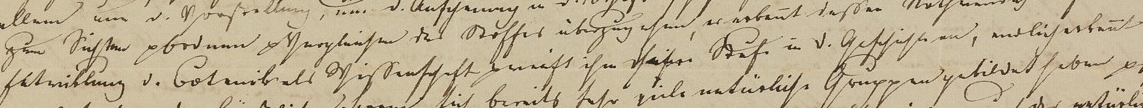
Entwiklung d. Botanik als Wissenschaft & weist ihm seine Stufe in d. Geschichte an, endlich erkennt
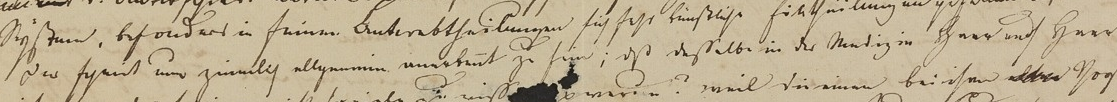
Das scheint nun ziemlich allgemein anerkannt zu sein; dß dasselbe in der Medizin Haar auf Haar
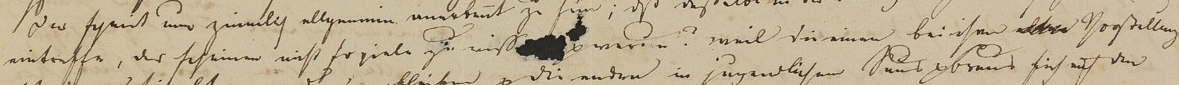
eintreffe, das scheinen nicht so viele zu wissen & warum? weil die einen bei ihren alten Vorstellungen
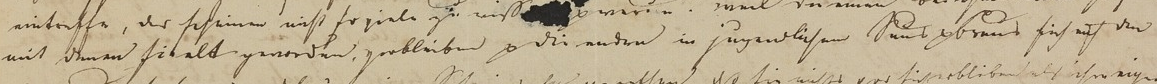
mit denen sie alt geworden, verbleiben & die andern in jugendlichem Saus & Braus sich auf den
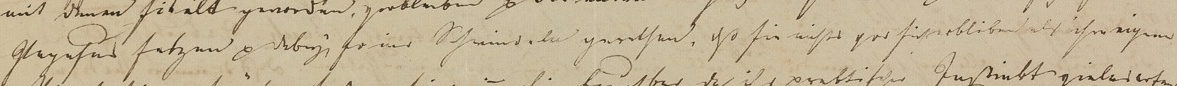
Pegasus setzen & dabey so ins Schwindeln gerathen, dß sie nichts vor sich erbliken als ihre eignen
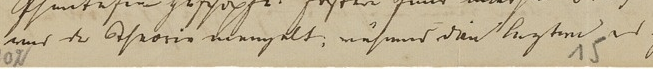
was der Theorie mangelt, während die leztern es
